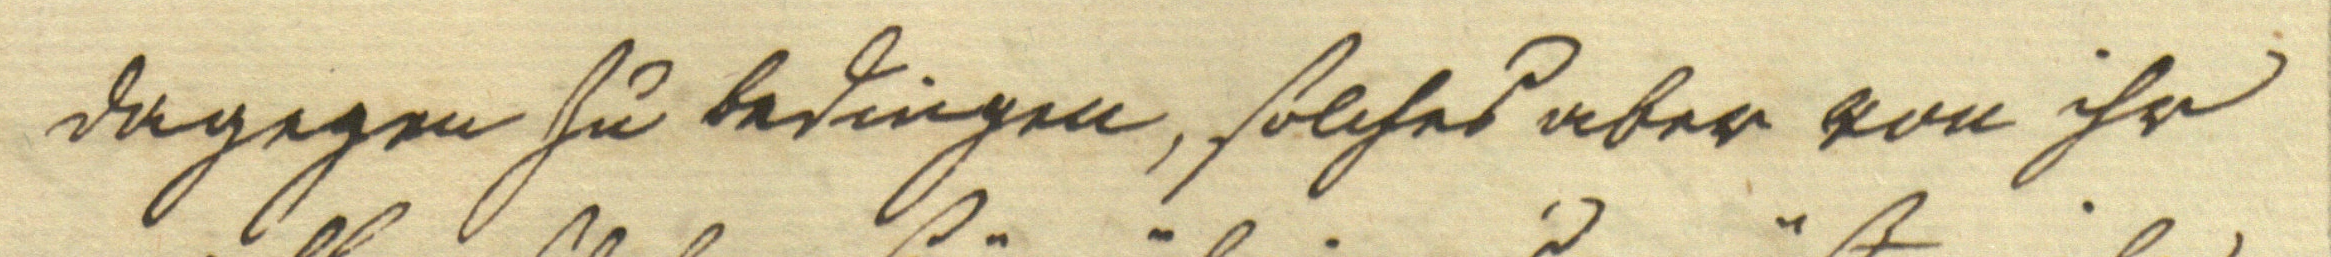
dagegen zu bedingen, solches aber von ihr
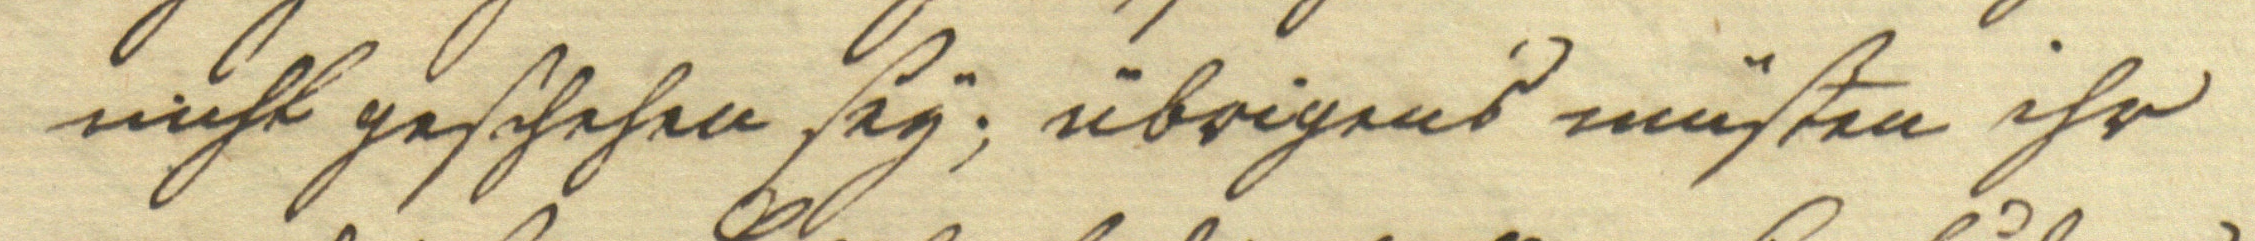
nicht geschehen seÿ; übrigens müßten ihr
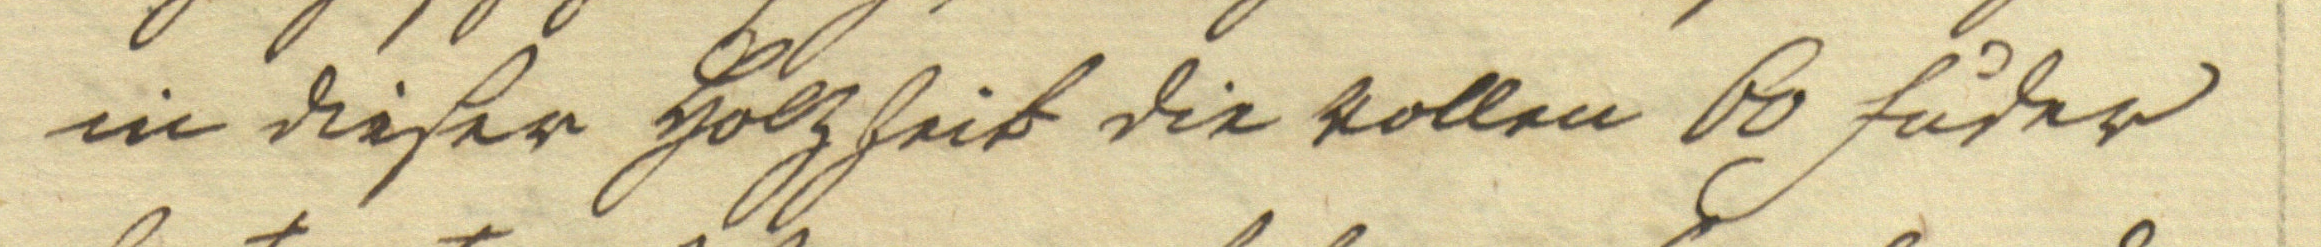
in dieser Holz Zeit die vollen 60 Fuder
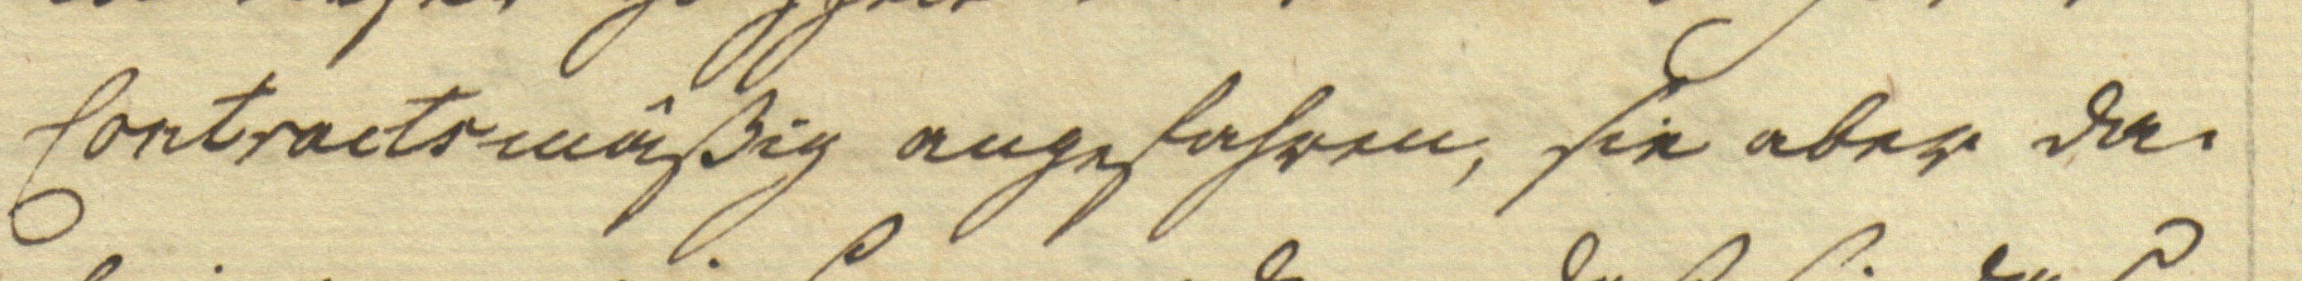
Contractsmäßig angefahren, sie aber da¬
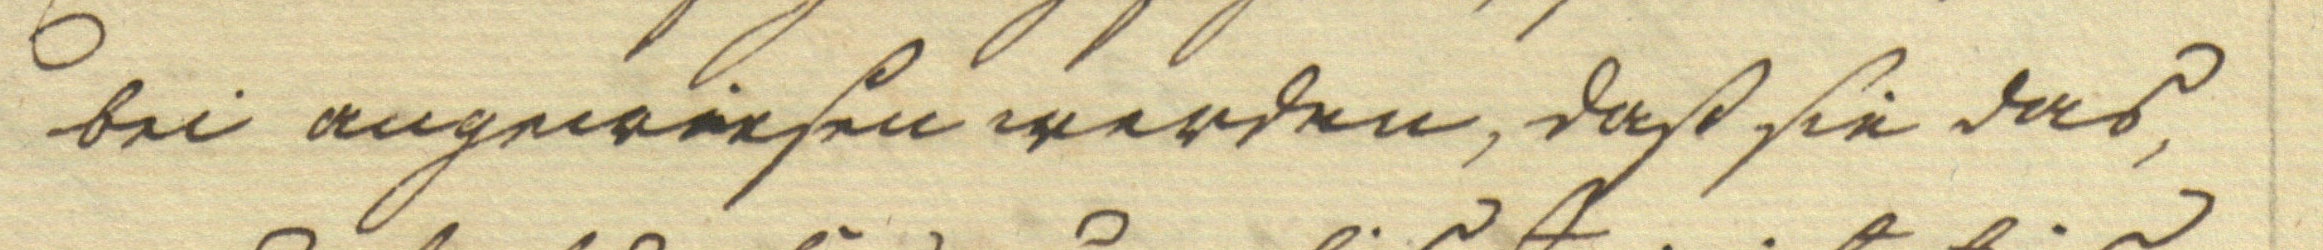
bei angewiesen werden, daß sie das,
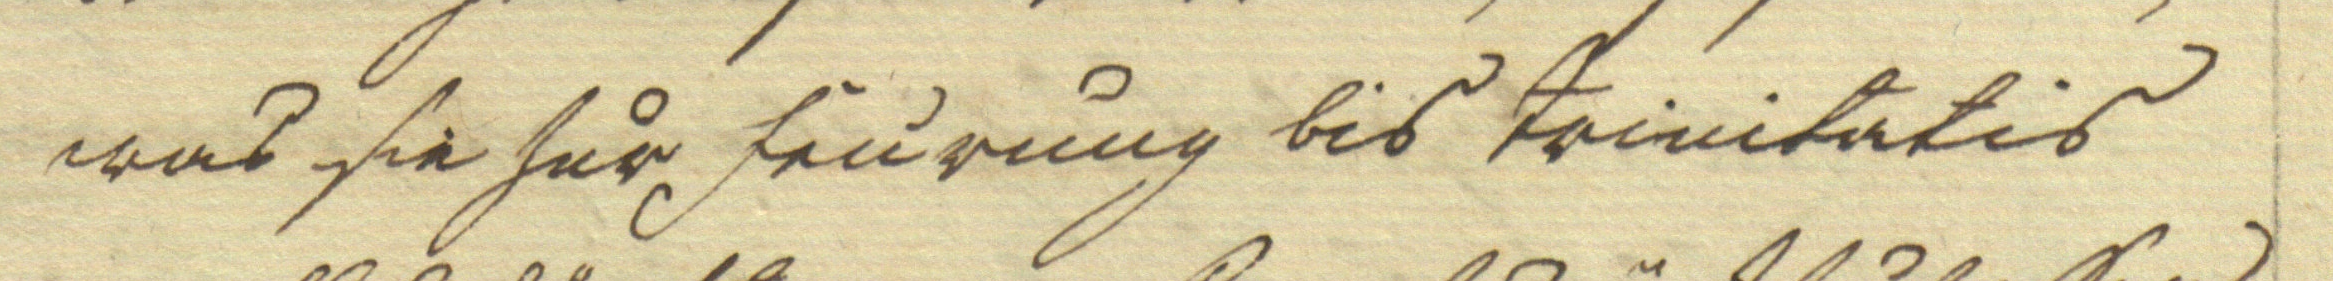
was sie zur Feurung bis Trinitatis
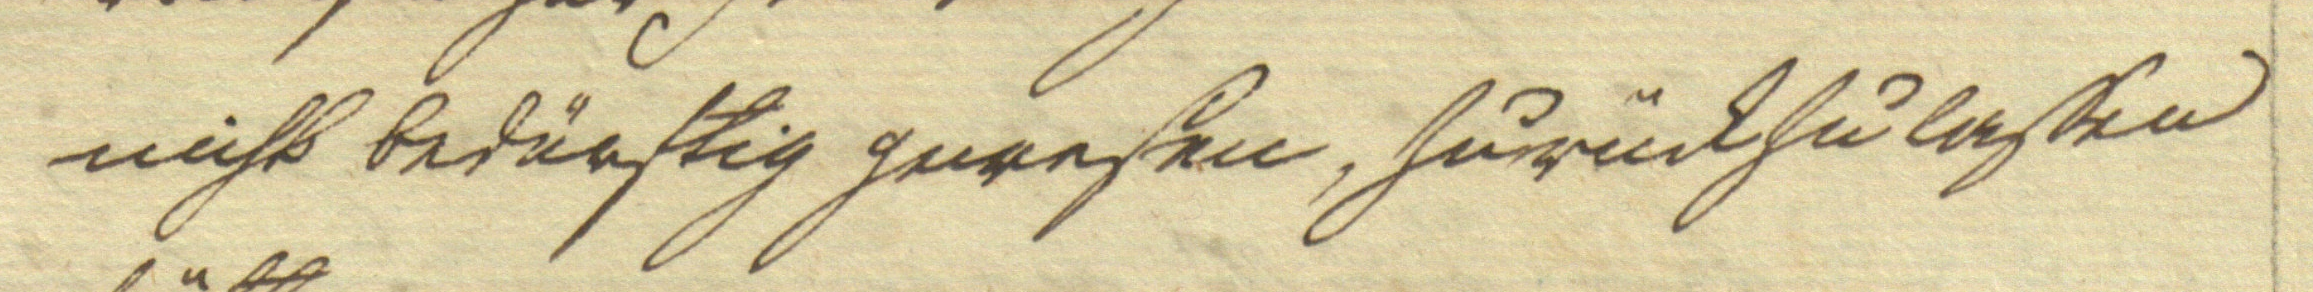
nicht bedürftig gewesen, zurückzulassen
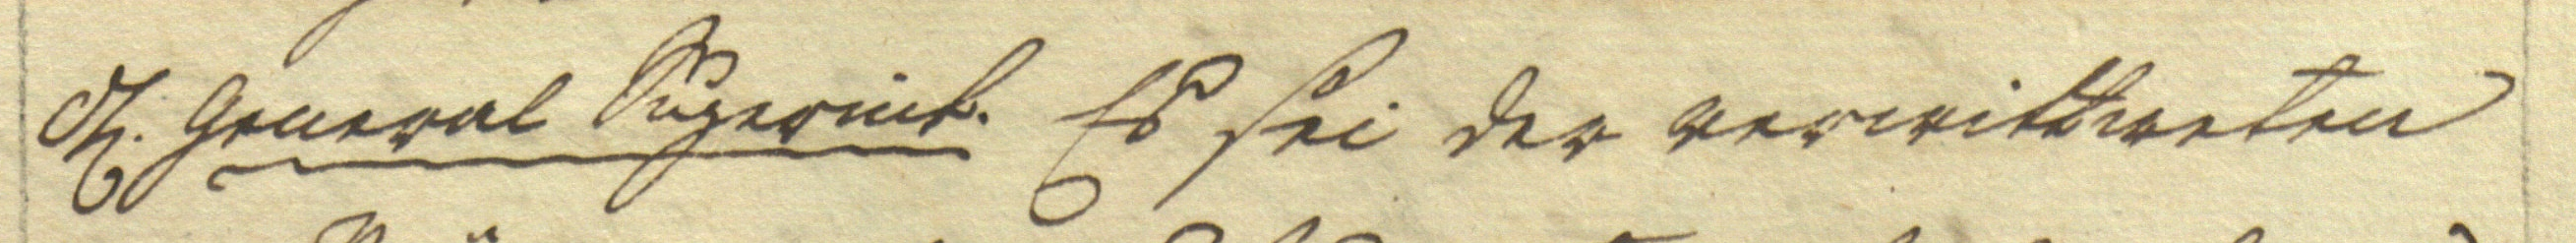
dh. General Superint. Es sei der verwittweten
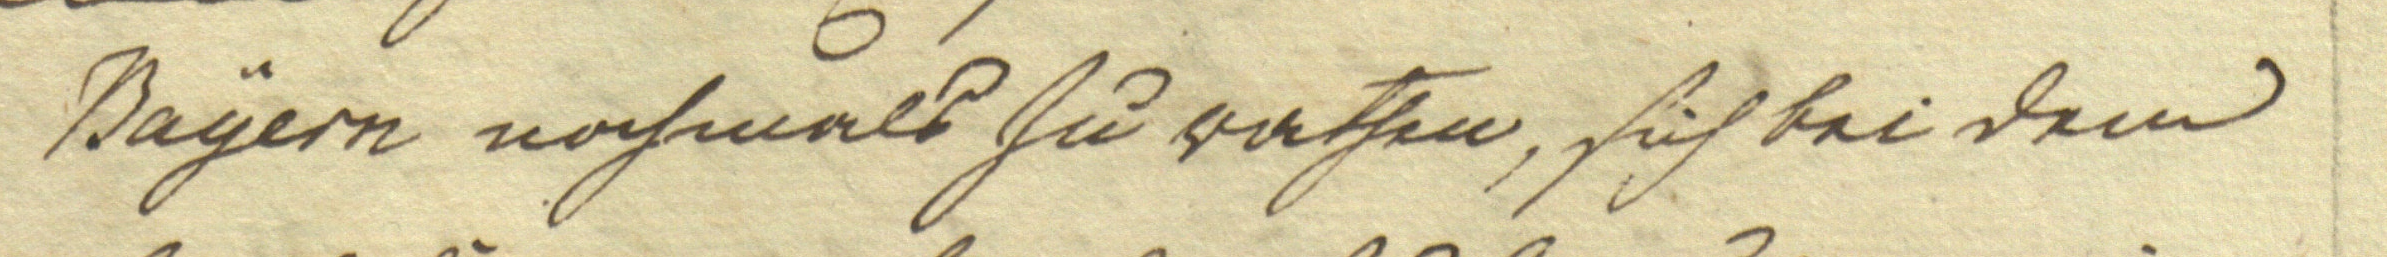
Baÿern nochmals zu rathen, sich bei dem
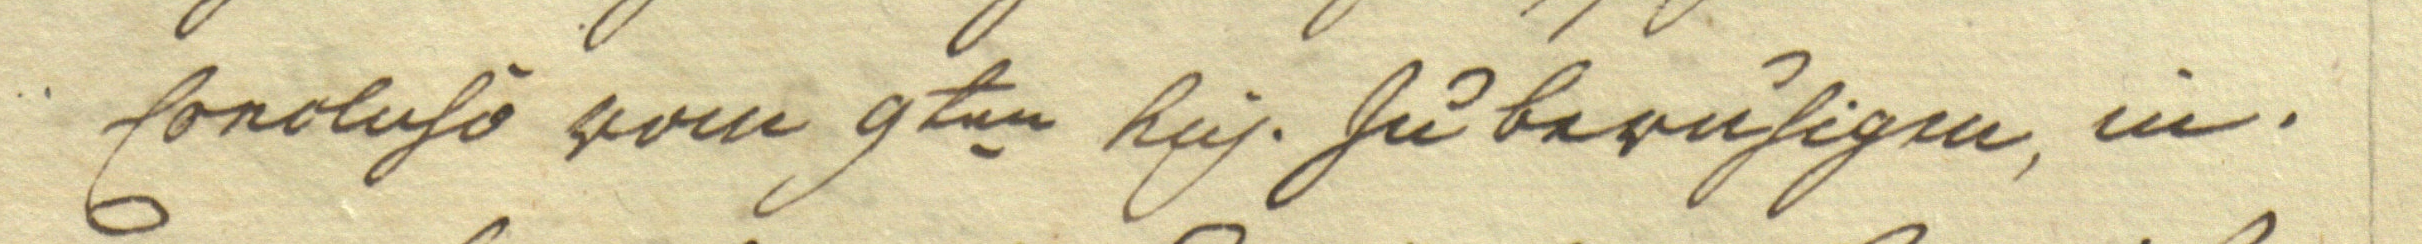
Concluso vom 9 ten huj. zu beruhigen, in¬
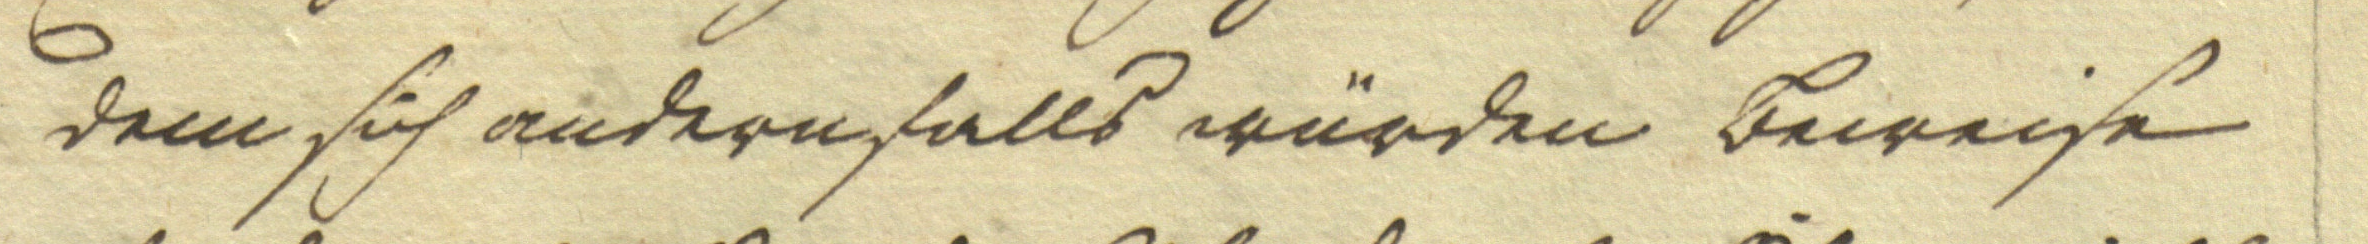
dem sich andernfalls würden Beweise
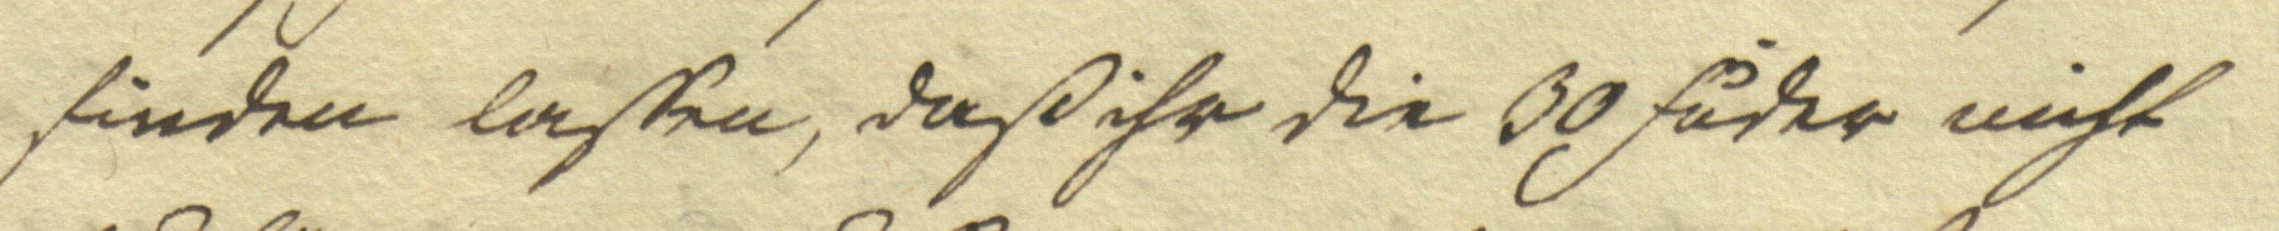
finden lassen, daß ihr die 30 Fuder nicht
